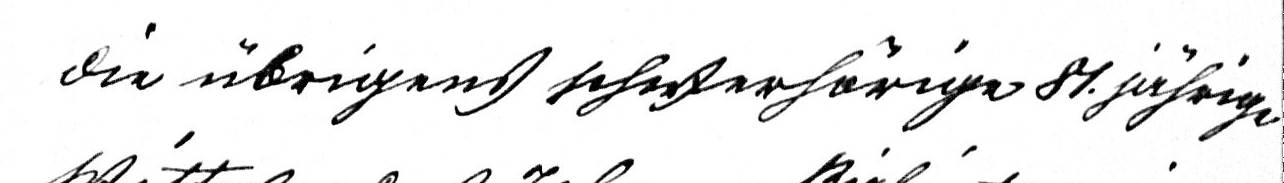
die übrigens schwerhörige 81. jährige
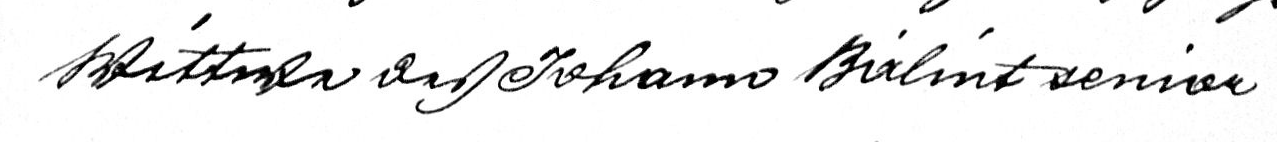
Wittwe des Johann Bálint senior
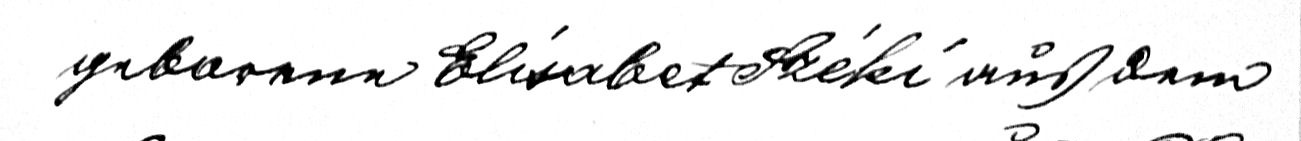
geborene Elisabet Széki aus dem
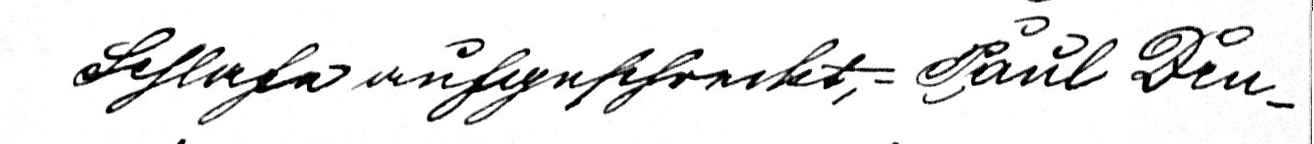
Schlafe aufgeschreckt, Paul Dru¬
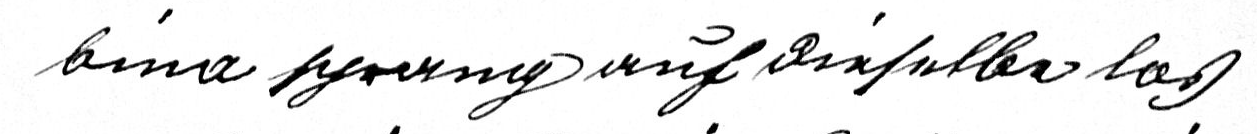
bina sprang auf dieselbe los
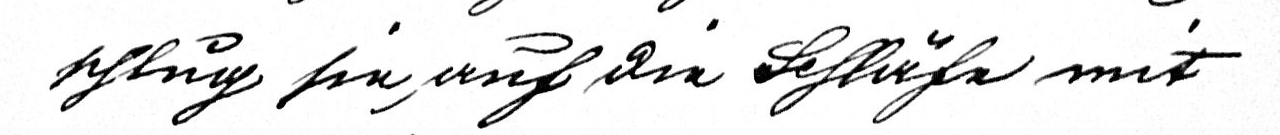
schlug sie, auf die Schläfe mit
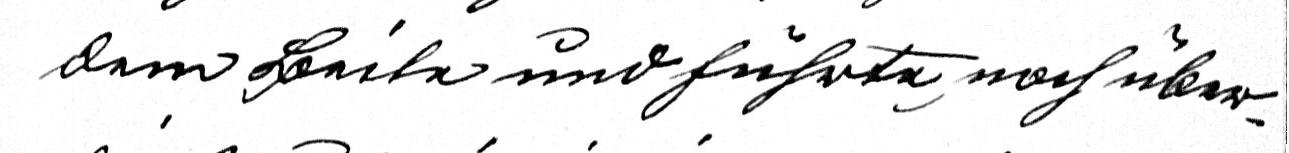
dem Beile und führte, noch über¬
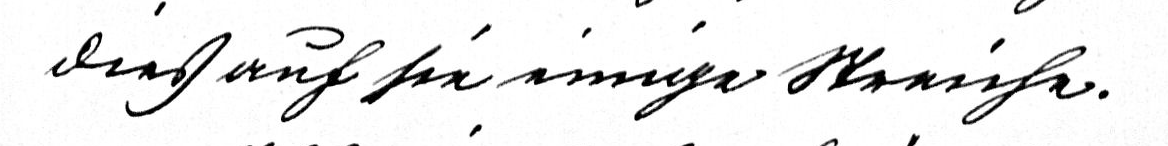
dies auf sie einige Streiche.
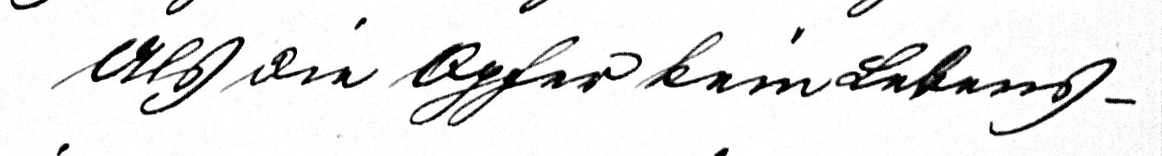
Als die Opfer kein Lebens¬
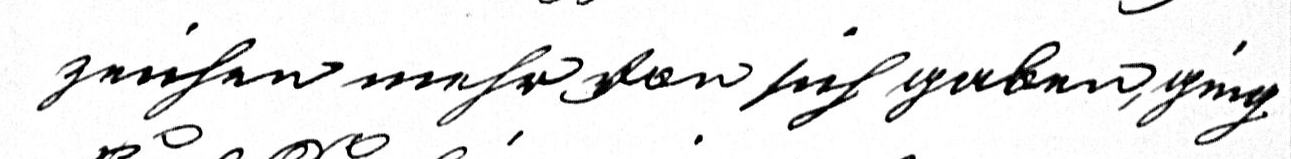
zeichen mehr von sich gaben, ging
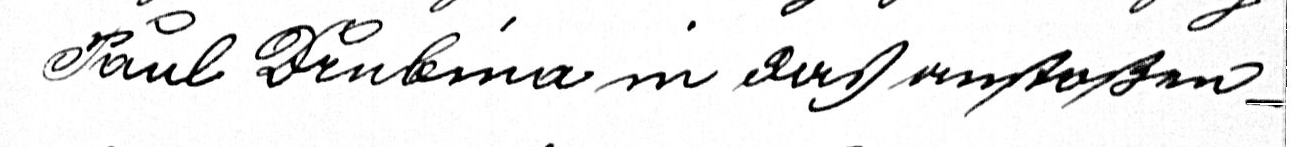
Paul Drubina in das anstoßen¬
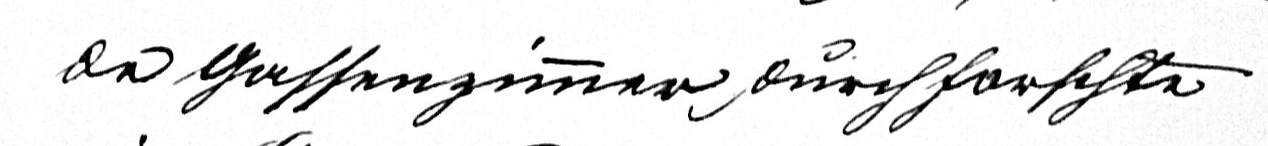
de Gassenzimmer durch forschte
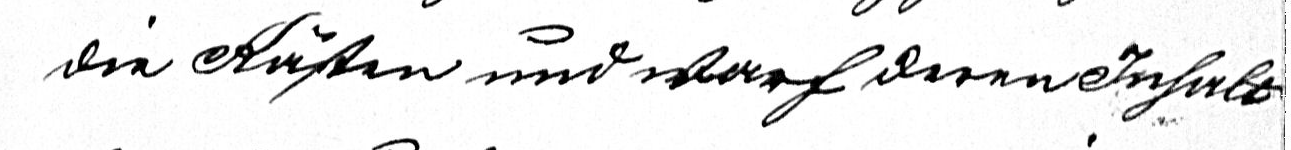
die Kästen und warf deren Inhalt
